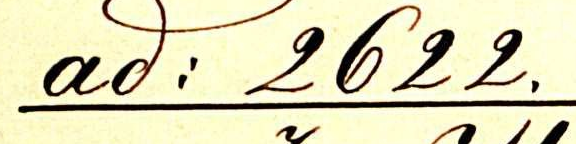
ad 2622
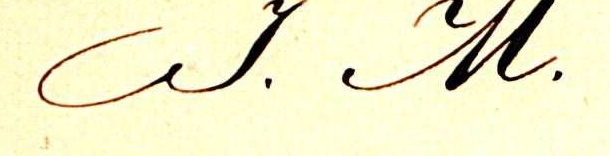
J.M.
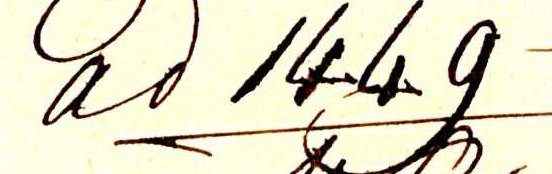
ad 1449
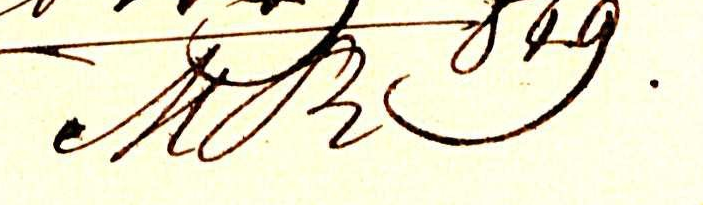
MR 849
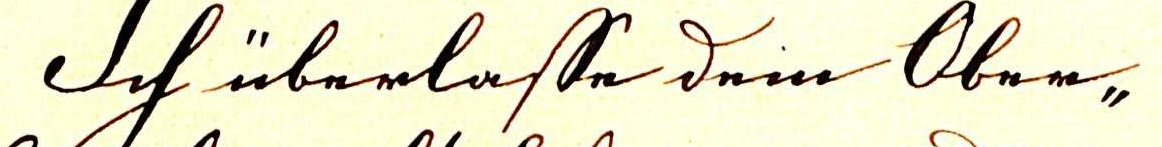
Ich überlasse dem Ober¬
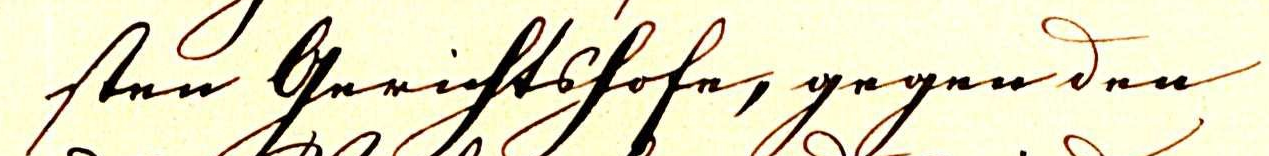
sten Gerichtshofe, gegen den
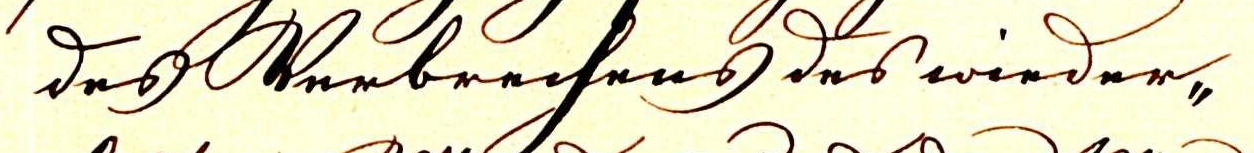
des Verbrechens des wieder¬
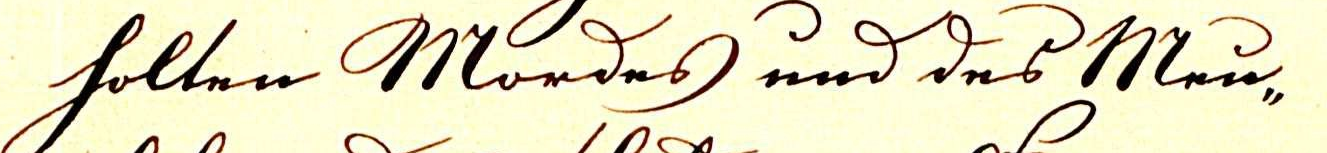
holten Mordes und des Meu¬
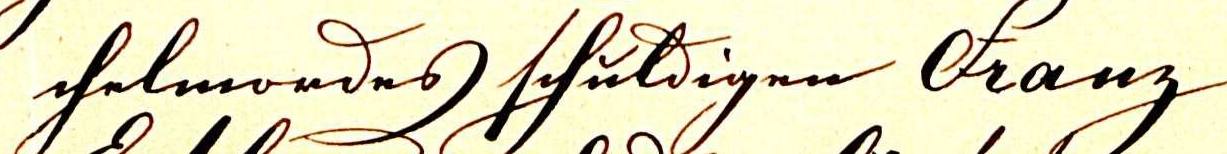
chelmordes schuldigen Franz
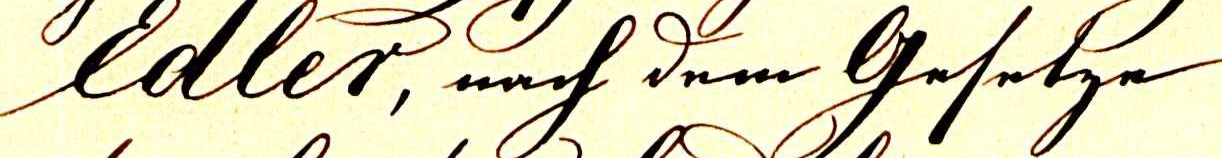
Edler, nach dem Gesetze
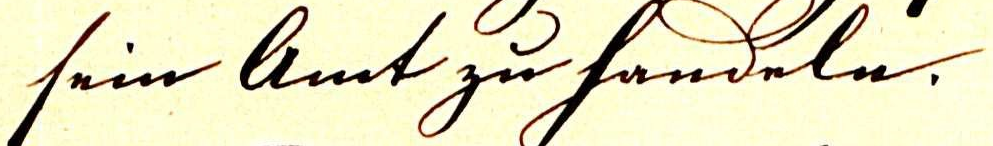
sein Amt zu handeln.
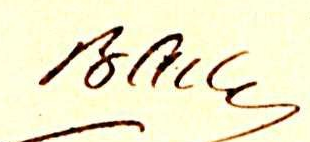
Bach
